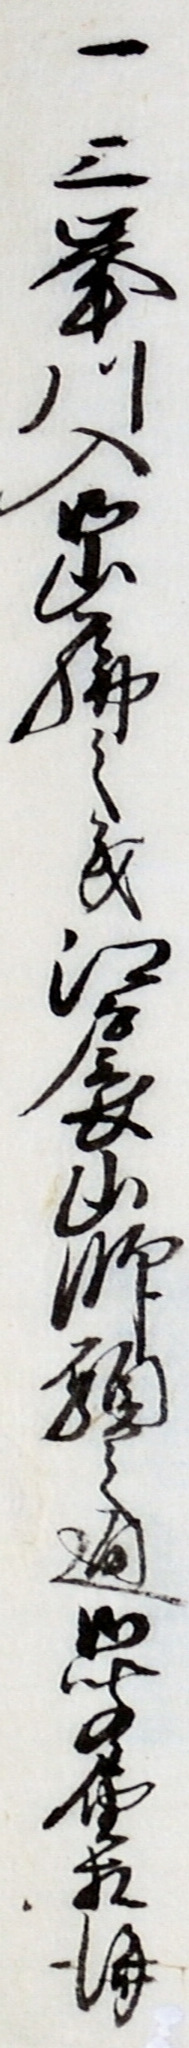一三峯川入御山払之義江戸表山師願之通御聞届相済
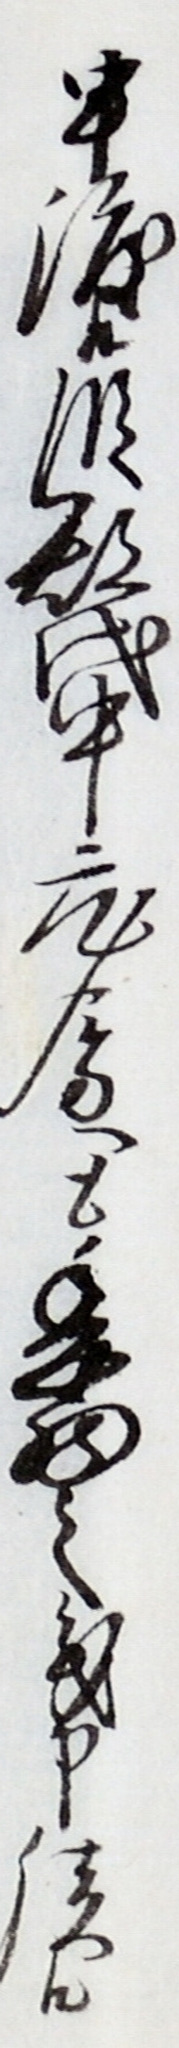申渡候段郡代中元〆方へも委細之義申談候
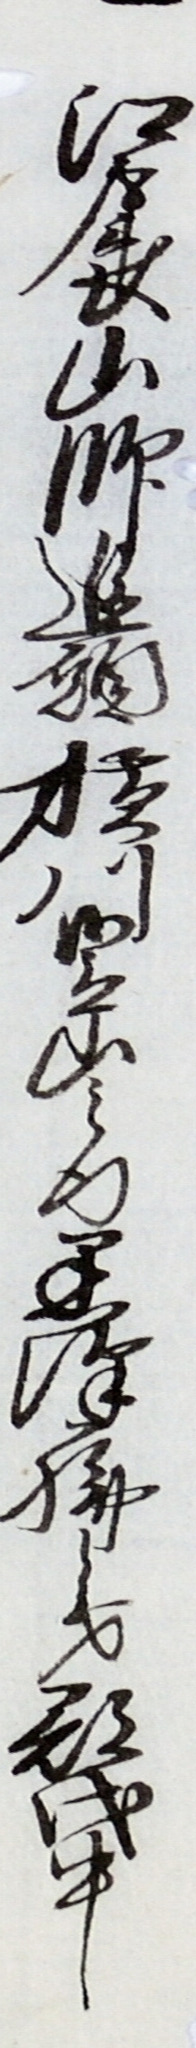一江戸表山師追願横川御立山之内黒澤御払之義才郡代中
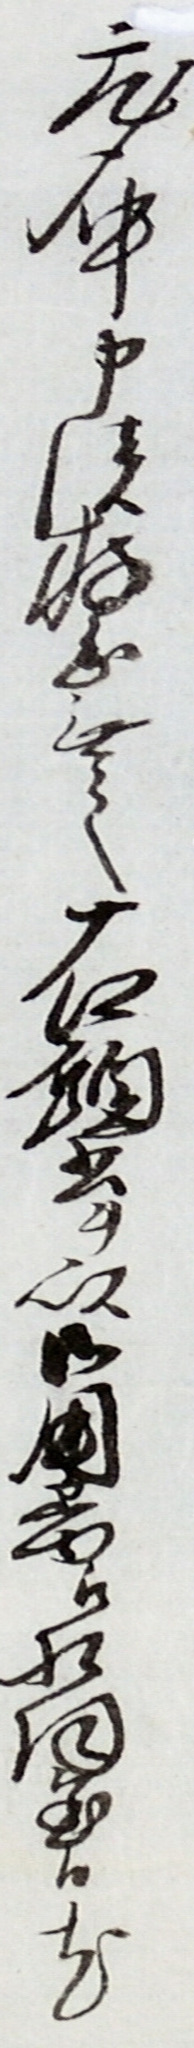元〆中申談置無之右願書ヲ以御用番江相調置候尤
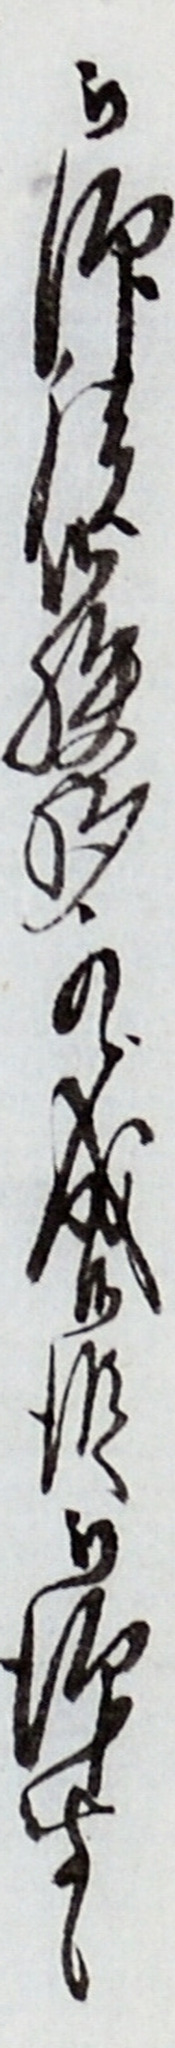被仰渡御挨拶可被成候段被仰聞候
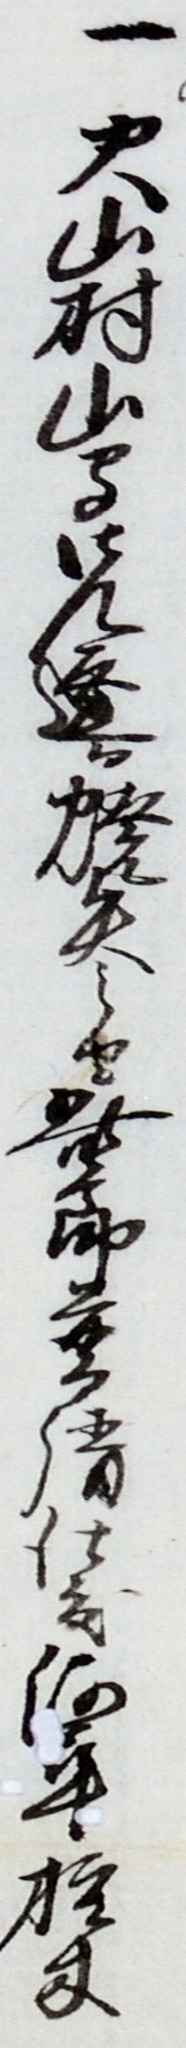一火山村山守先達而焼失之由此節普請仕度何卒木
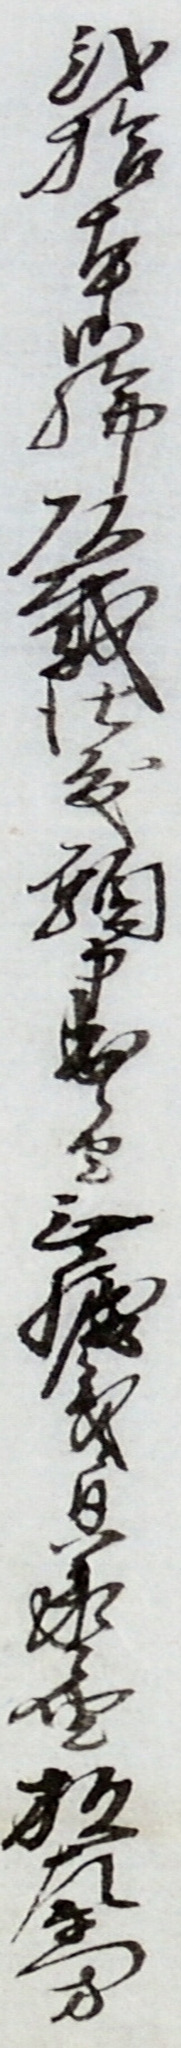弐拾本御払頂戴仕度願申出候由無拠義ニ付承届申杉左衛門方
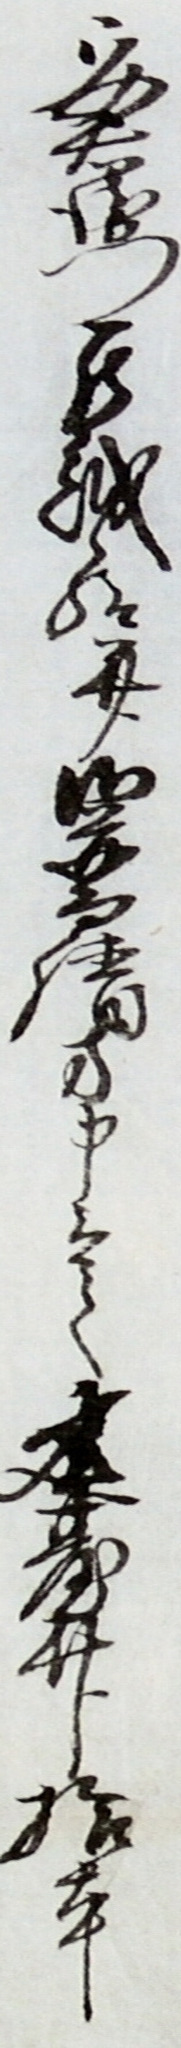安右衛門罷越候様并御普請方申有之建竹拾本
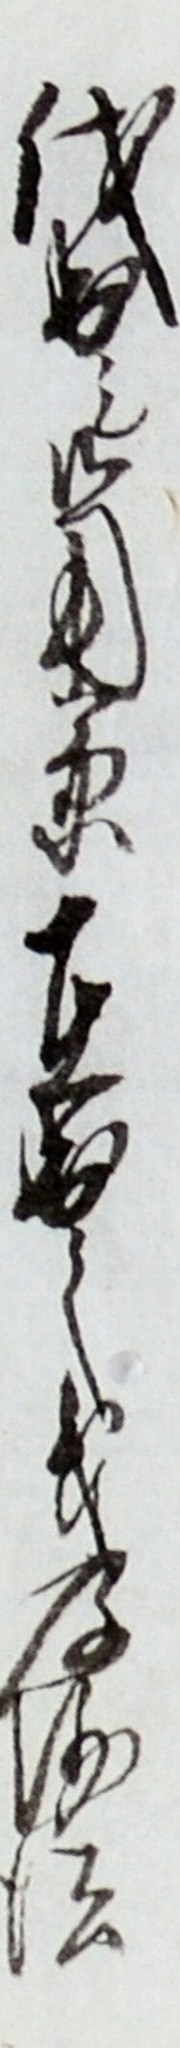伐出し御用兼出之義及沙法
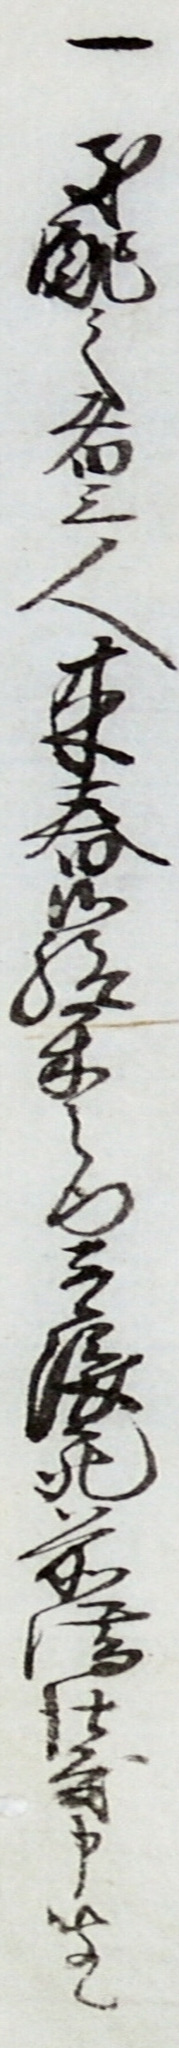一支配之者三人来春御緒木之内壱帳宛前借仕度申聞候
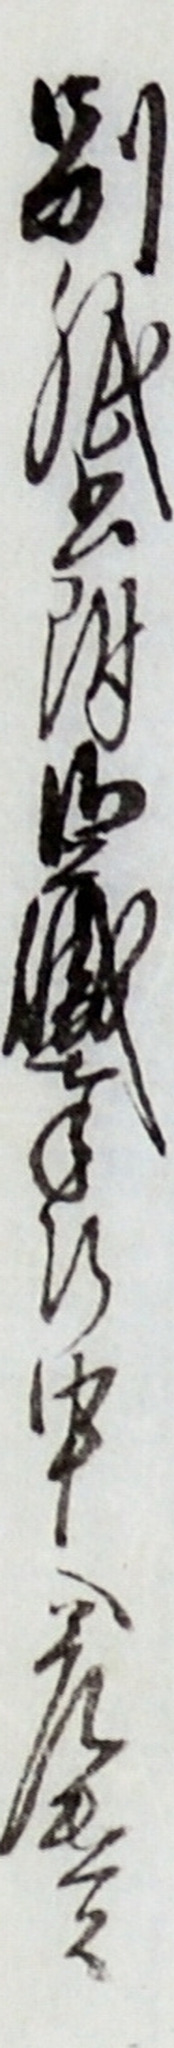別紙書附御蔵奉行中へ差遣候

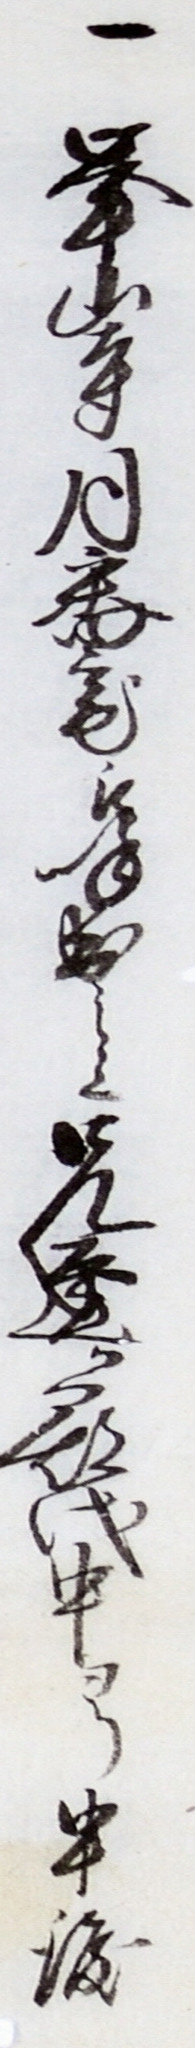一峯山寺月番宅江呼出之上先達郡代中ヨリ申渡
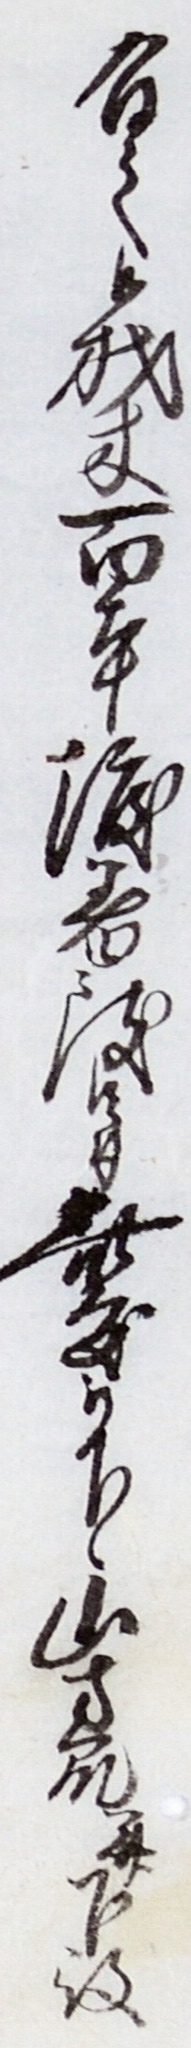有之候材木百本渡番致候ニ付此度被下候山方衆并下役
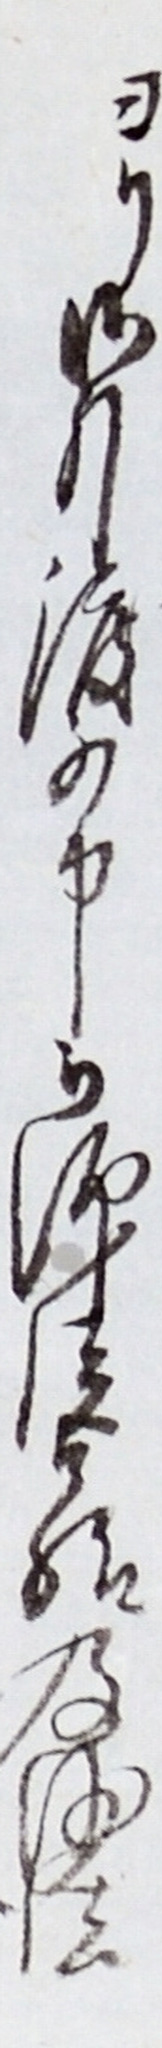ヨリ御引渡可申候仰談候様及沙汰
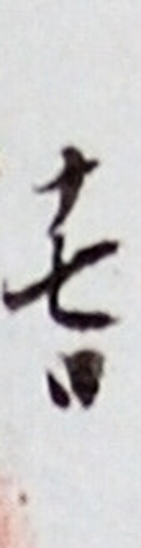十七日
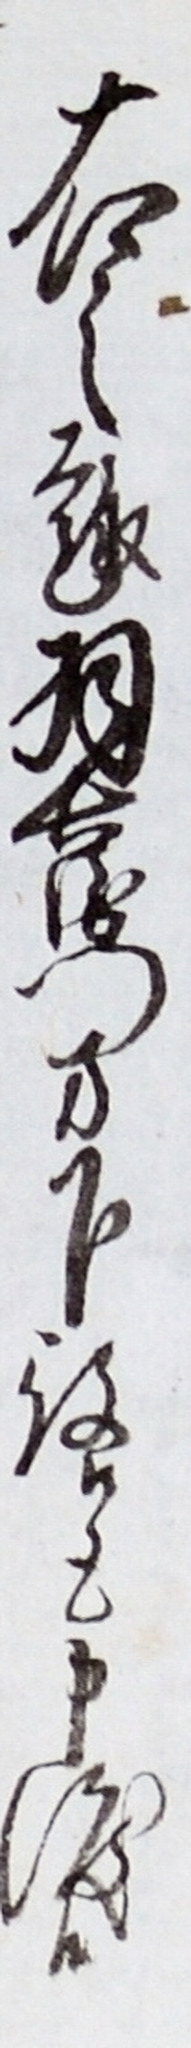右之趣羽右衛門方下役江も申渡候
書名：御山奉行御用控
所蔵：伊那市立高遠町図書館・合同会社AMANE
